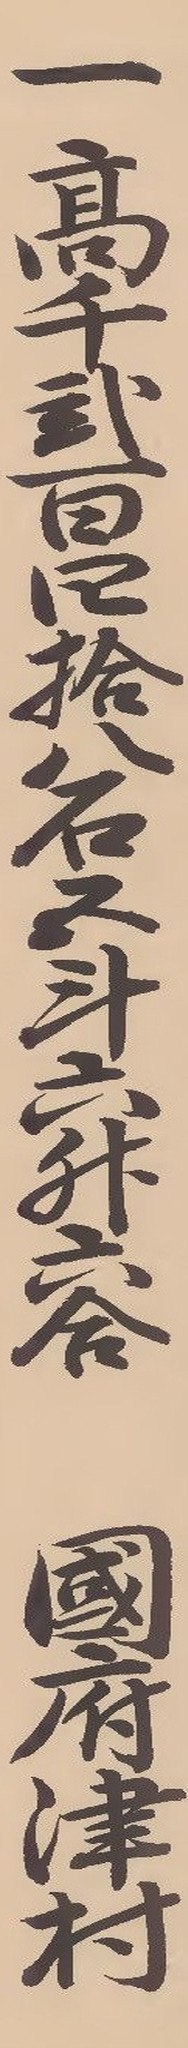一高千弐百四拾八石五斗六升六合国府津村
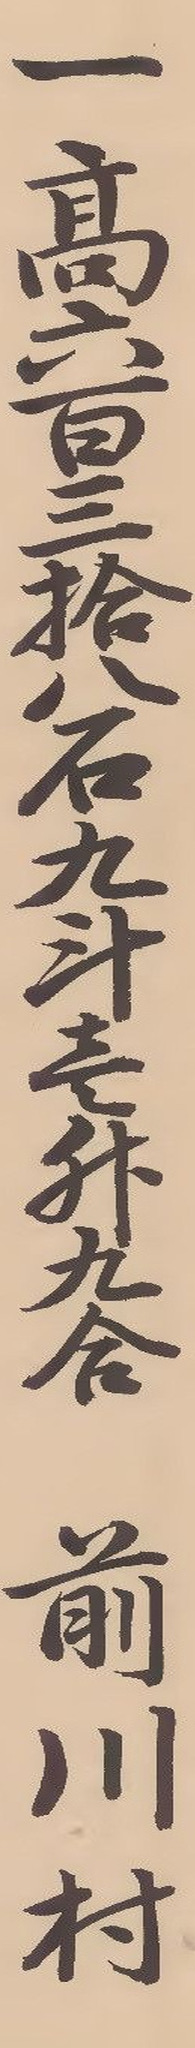一高六百三拾八石九斗壱升九合前川村
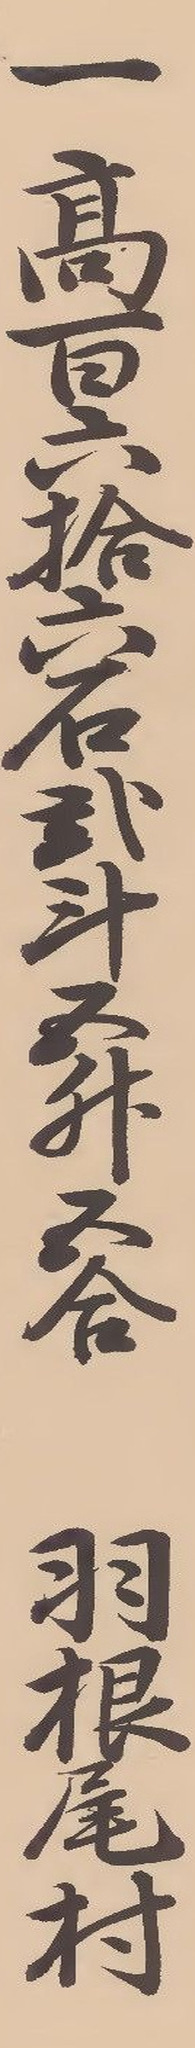一高百六拾六石弐斗五升五合羽根尾村
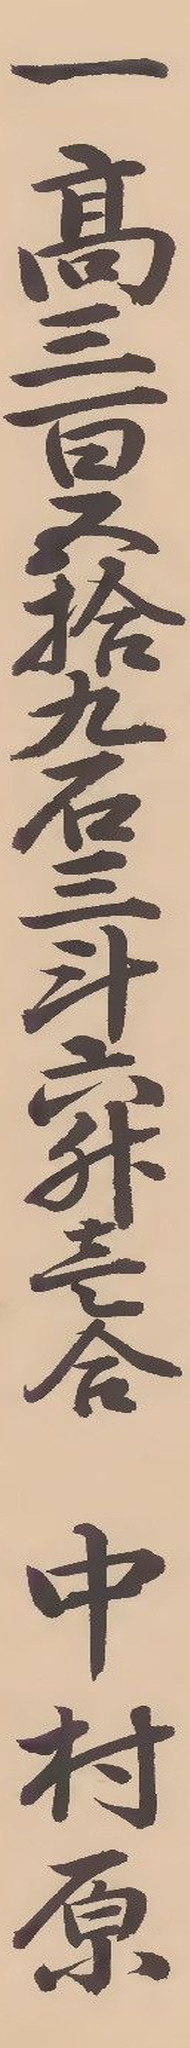一高三百五拾九石三斗六升壱合中村原

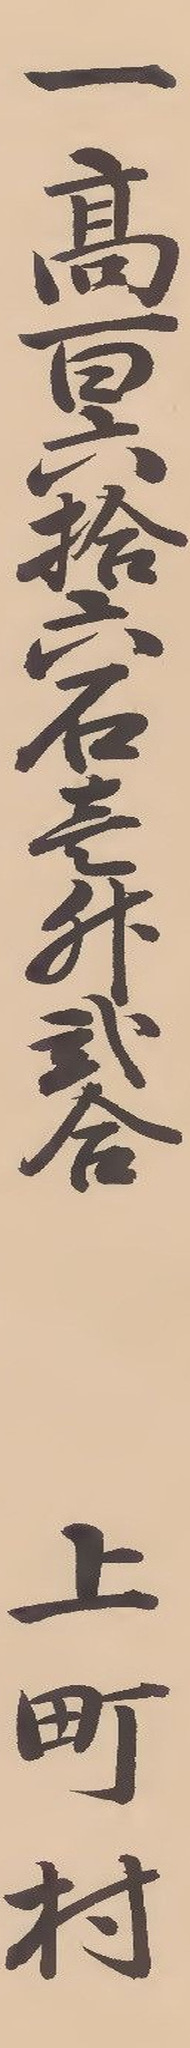一高百六拾六石壱升弐合上町村
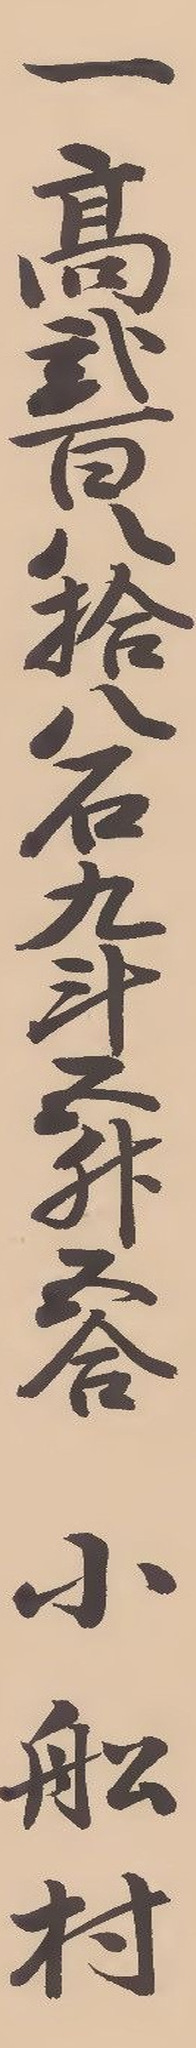一高弐百八拾八石九斗五升五合上町村
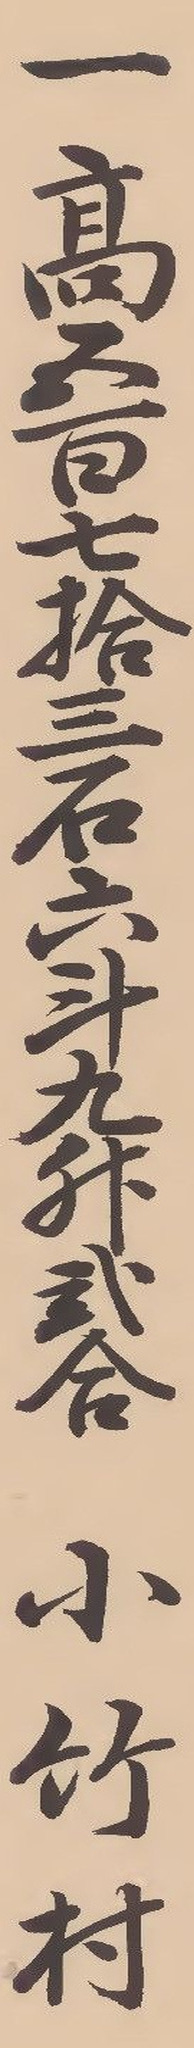一高五百七拾三石六斗九升弐合小竹村
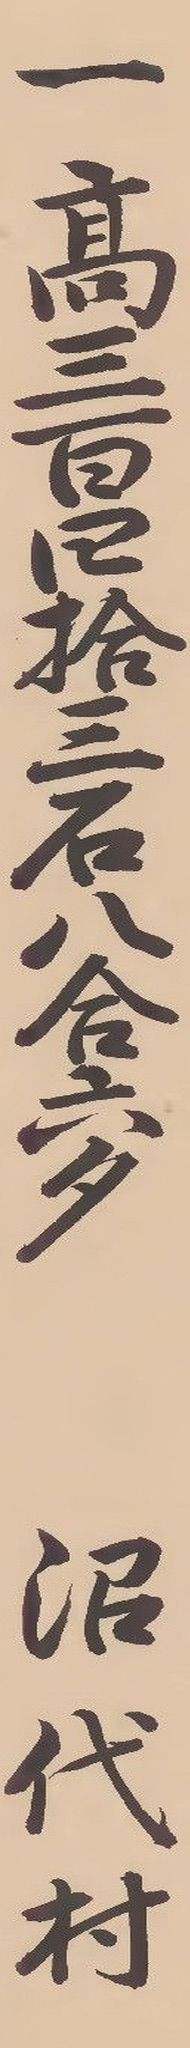一高三百四拾三石八合六勺沼代村
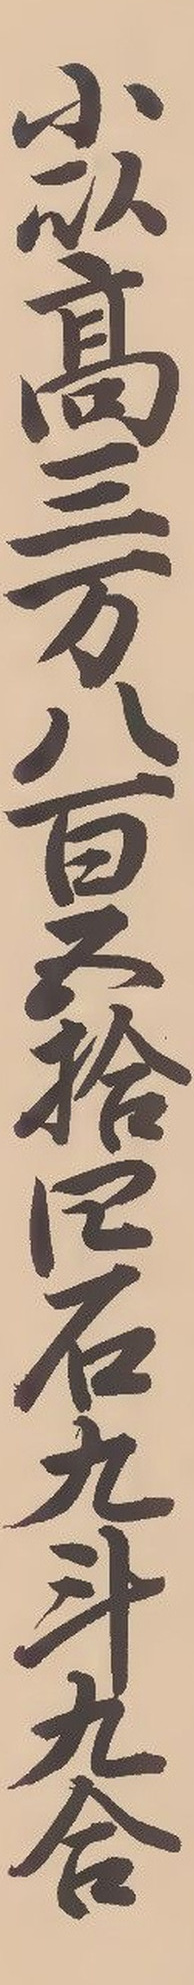小以高三万八百五拾四石九斗九合

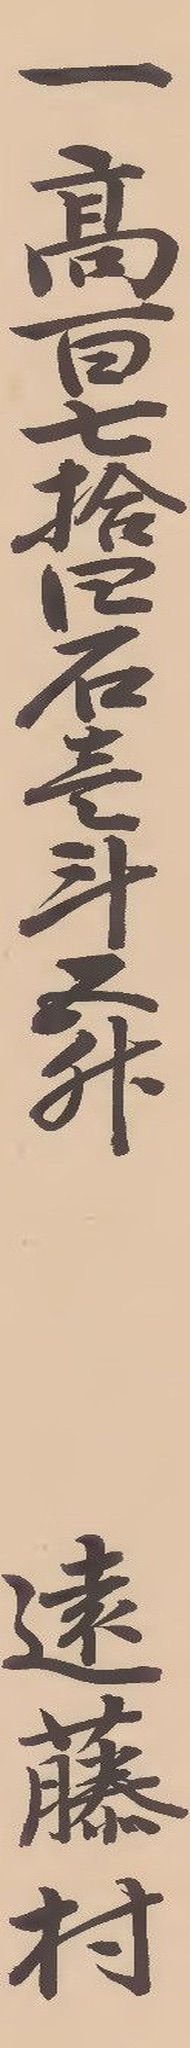一高百七拾四石壱斗五升遠藤村
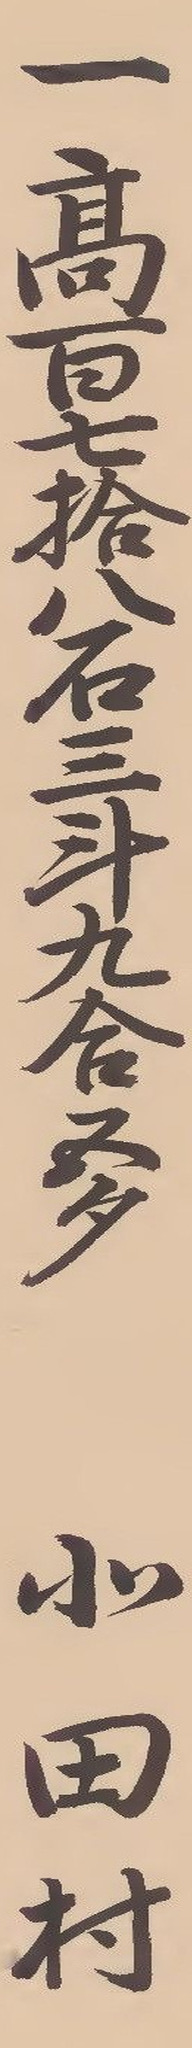一高百七拾八石三斗九合五勺北田村
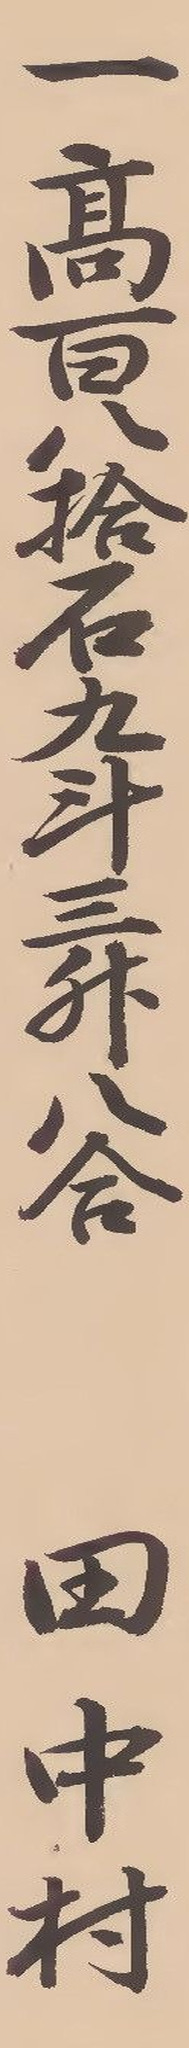一高百八拾石九斗三升八合田中村
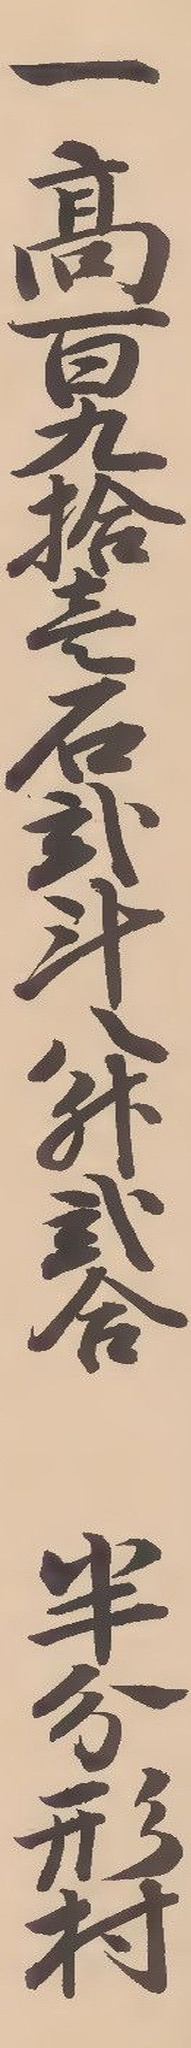一高百九拾壱石弐斗八升弐合半分形村
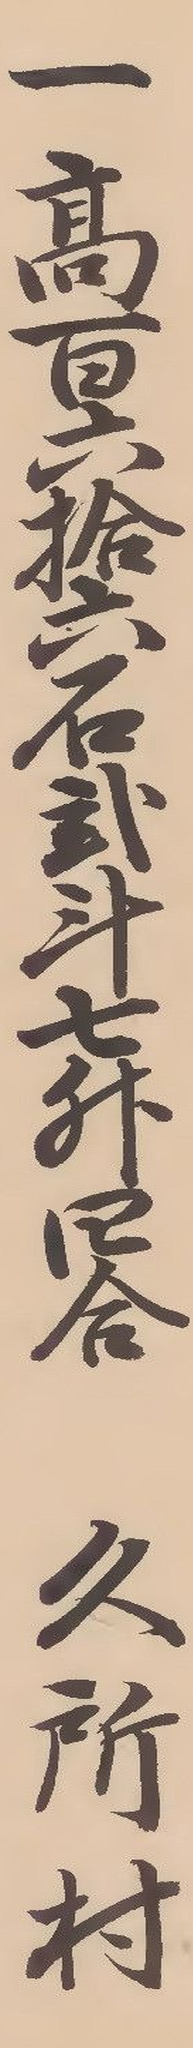一高百六拾六石弐斗七升四合久所村
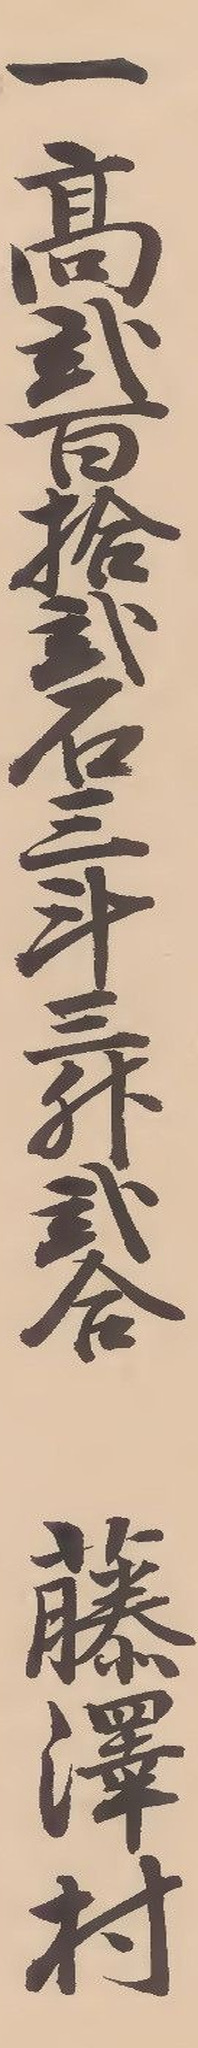一高弐百拾弐石三斗三升弐合藤沢村
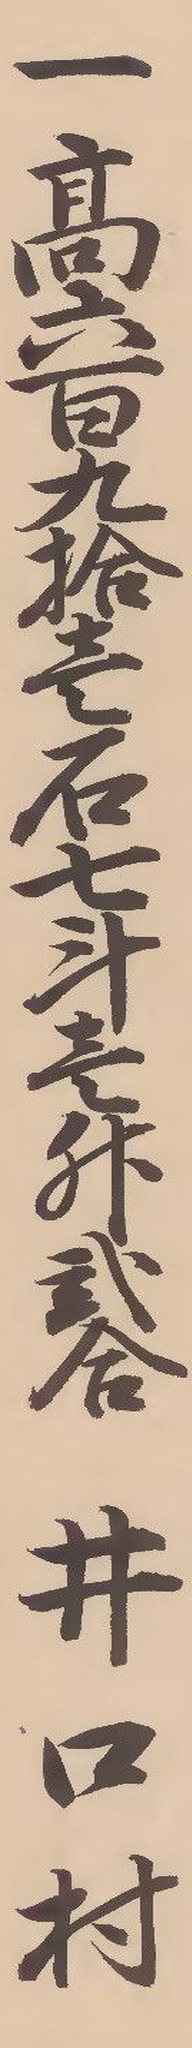一高六百九拾壱石七斗壱升弐合井口村
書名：相模国郷帳
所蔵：国立公文書館 National Archives of Japan
